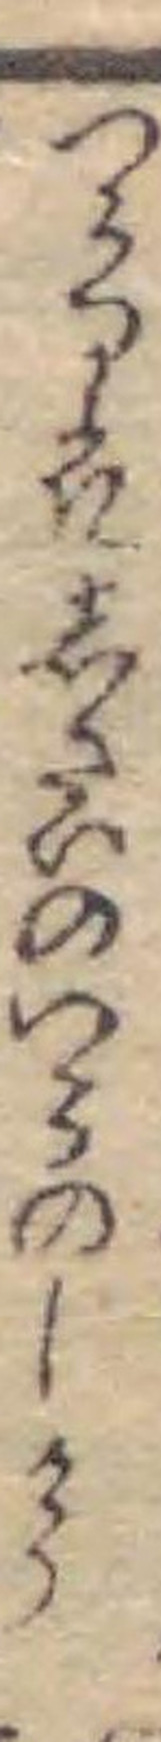つうりきしたいのいろのしかう
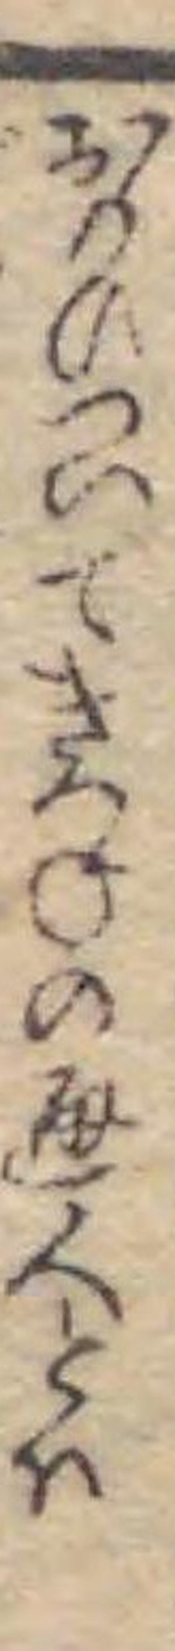おもひついてきつねの通人とは
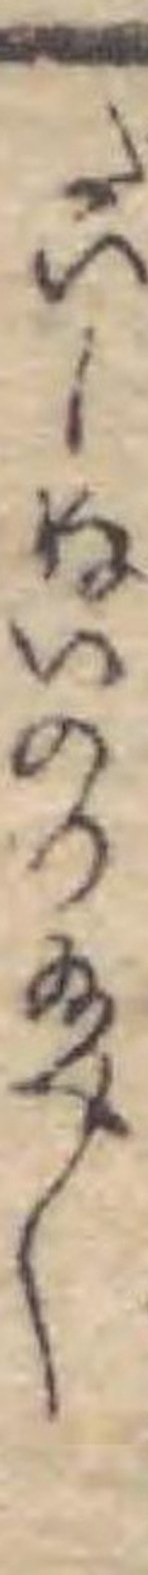だいしぬいのり給へ〳〵
